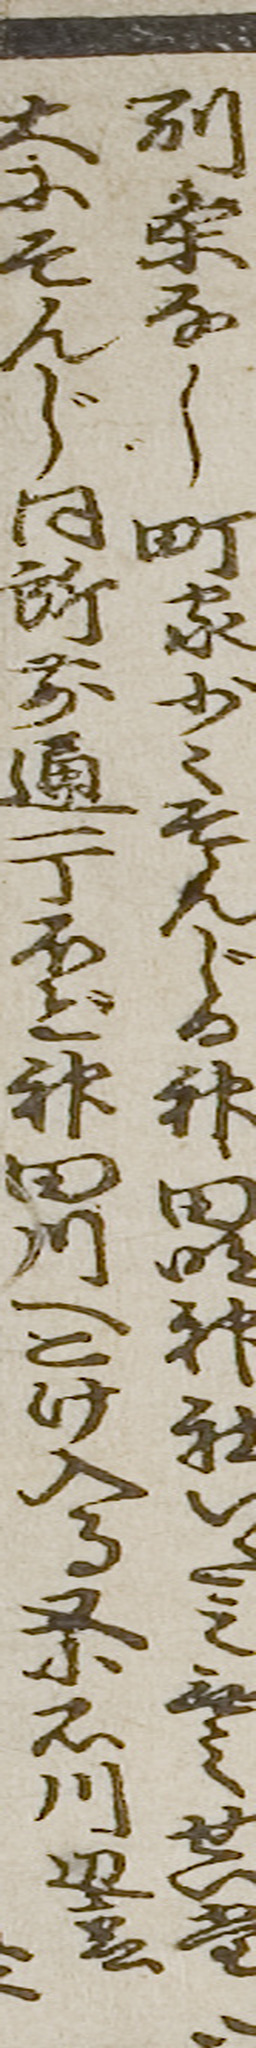大にそんじ同所前通一丁ほど神田川へこけ入る又小石川辺春
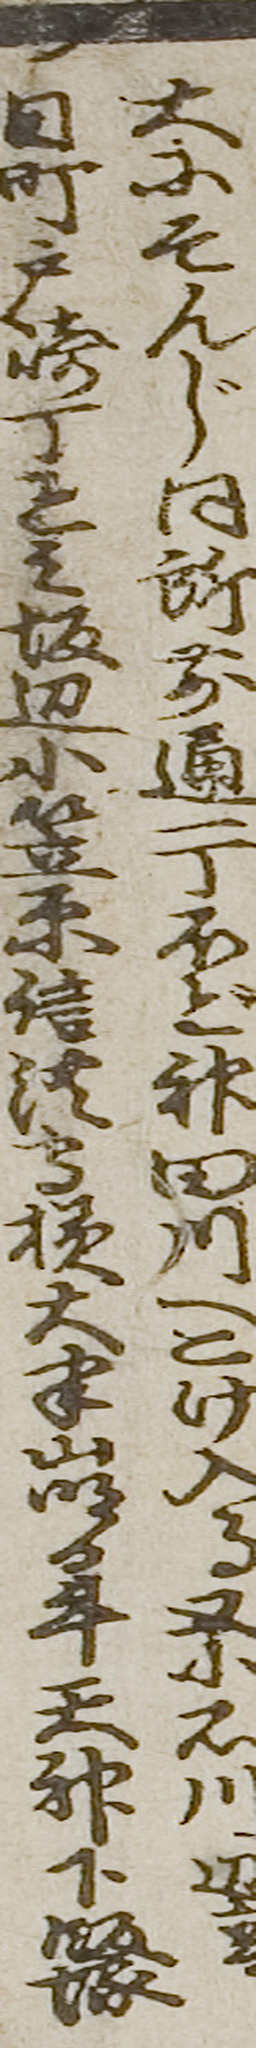日町戸崎丁とみ坂辺小笠原信濃守様大半崩る牛天神下飯塚
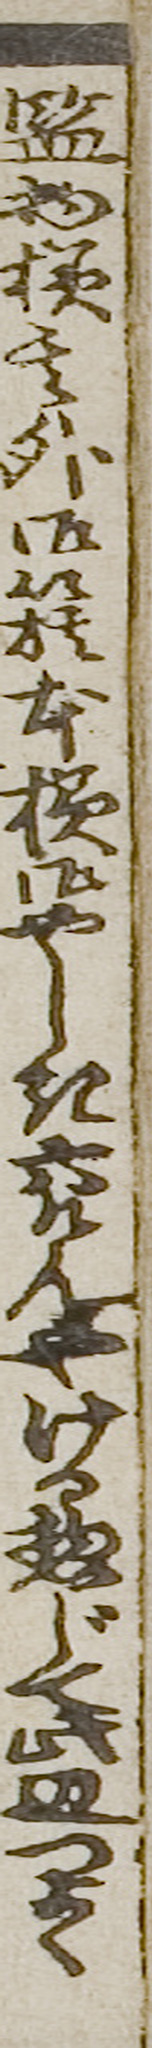監物様其外御旗本様御やしき六けんやける惣じて此辺つよく
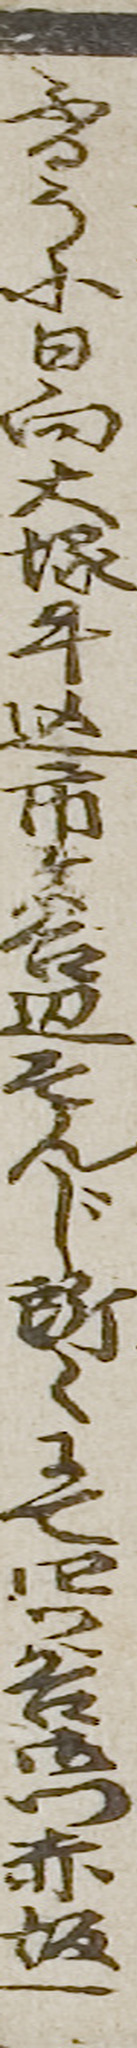ふるう小日向大塚牛込市ケ谷辺そんじ所々にて四ツ谷御門赤坂
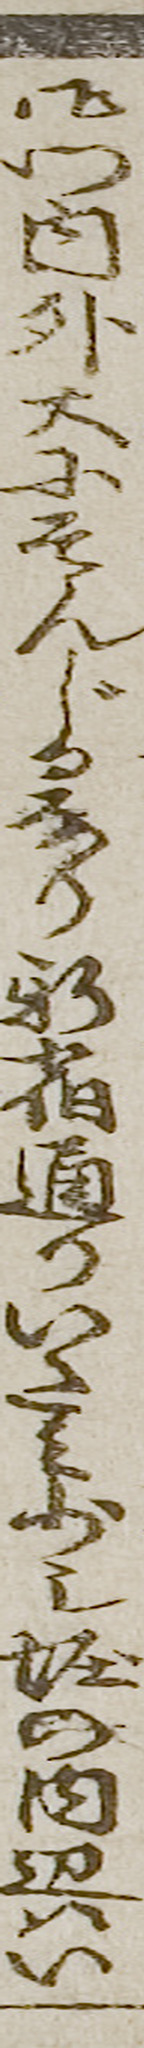御門内外大にそんじるなり新宿通りいたみ少シ堀の内辺はい
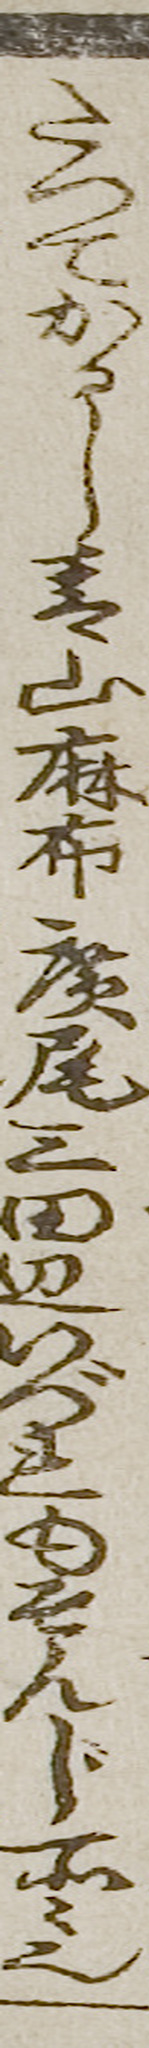たつてかるし青山麻布広尾三田辺いづれもそんじ所々也
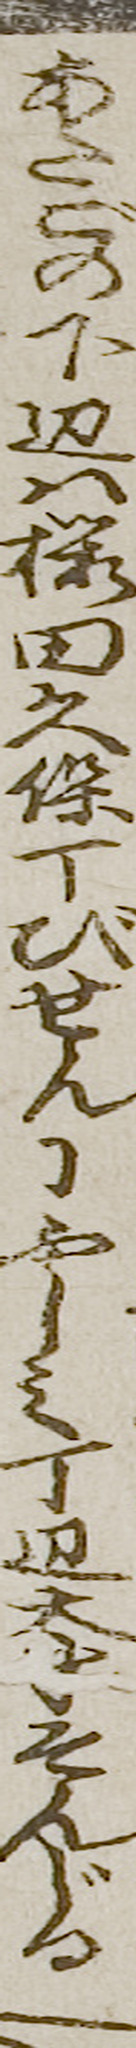あたごの下辺は桜田久保丁びせん丁ふしみ丁辺大半そんじる
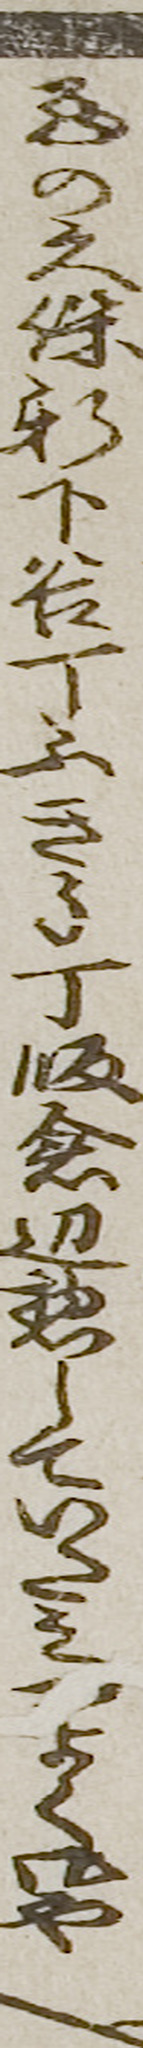西の久保新下谷丁ふき手丁飯倉辺惣していたみつよく御や
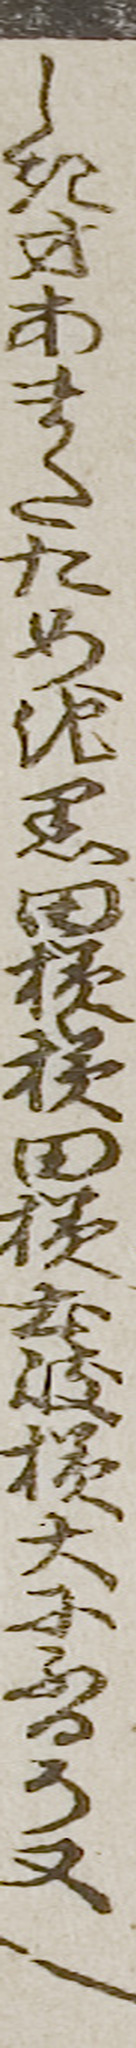しき方あまたため池黒田様様田様土岐様大にふるう又
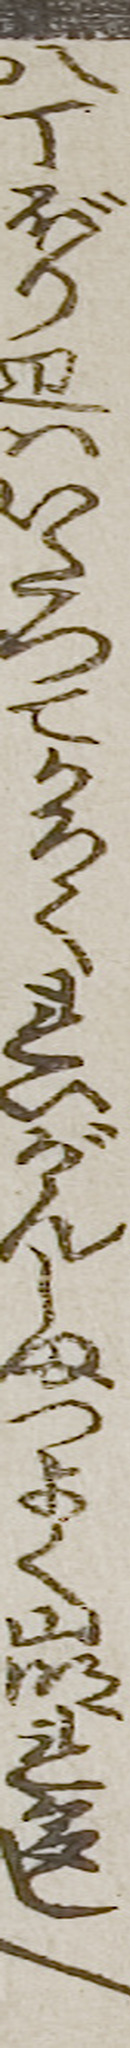八丁ぼり辺はいたつてかろくれいがんしまつよく崩れ多し

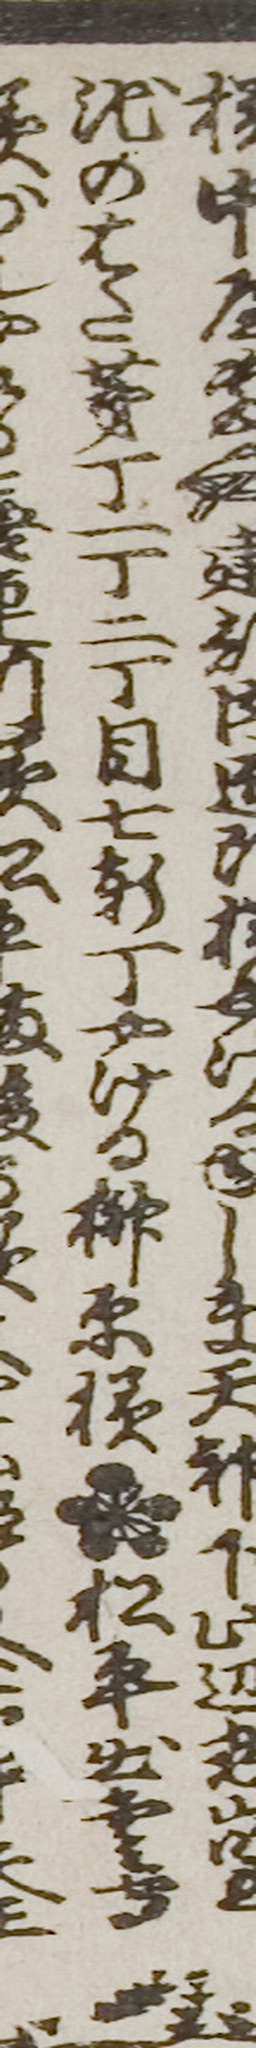池のはた茅丁一丁目二丁目七軒丁やける榊原様〇松平出雲守
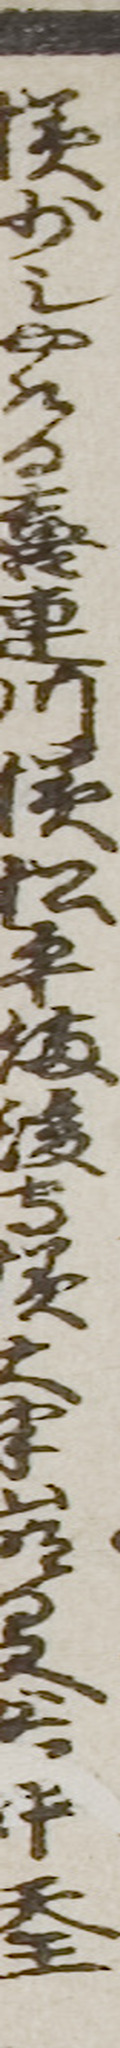様少シやける喜連川様松平備後守様大半崩る又谷中天王
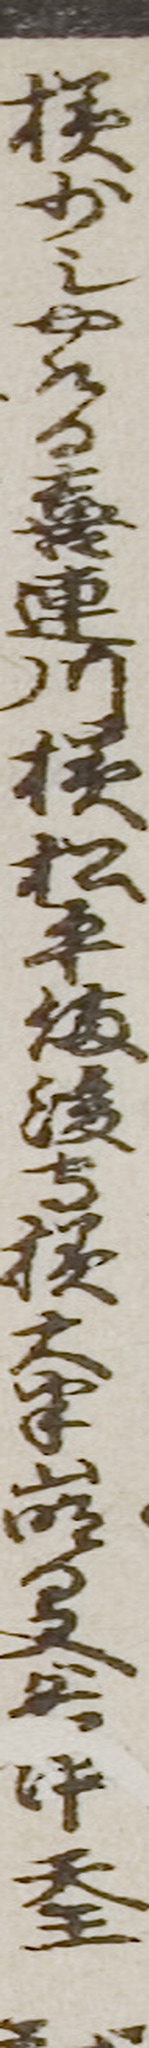様少シやける喜連川様松平備後守様大半崩る又谷中天王
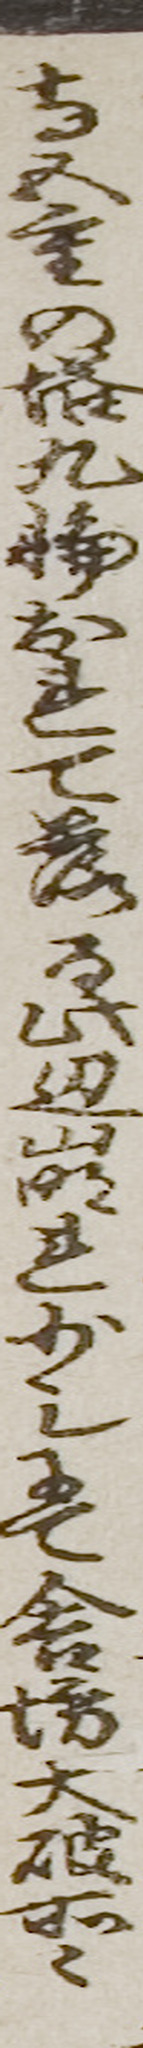寺五重の塔九輪おれて落る此辺崩れ少シにて舎坊大破所々
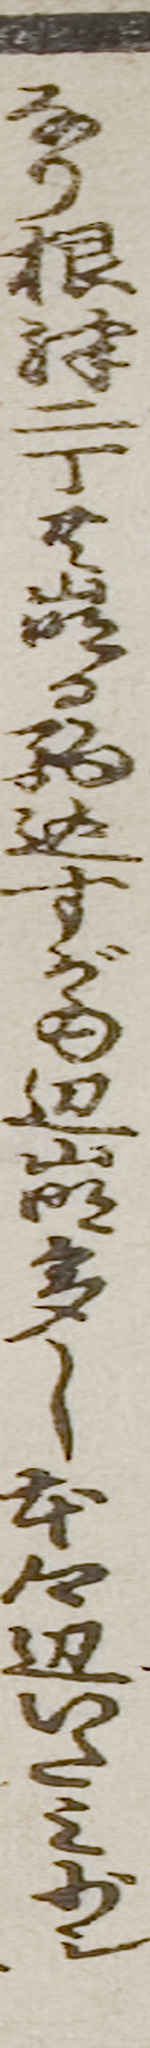なり根津二丁共崩る駒込すがも辺崩多し本郷辺いたみ少シ
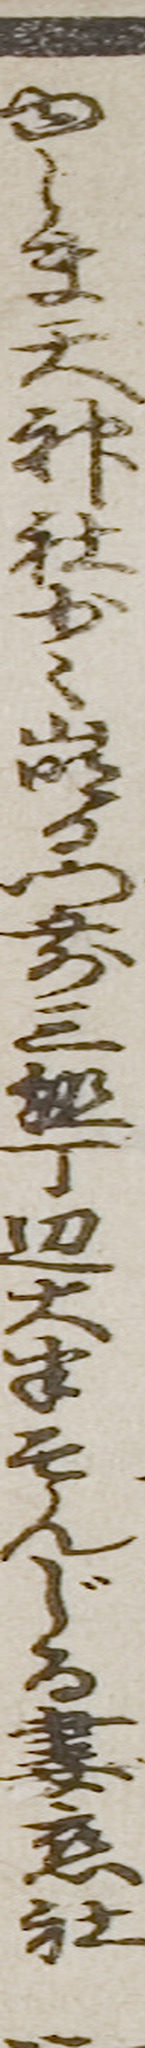ゆしま天神社少々崩る門前三組丁辺大半そんじる妻恋社
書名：安政改正泰平盤石図会
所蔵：東京大学総合図書館 General Library in the University of Tokyo, JAPAN
